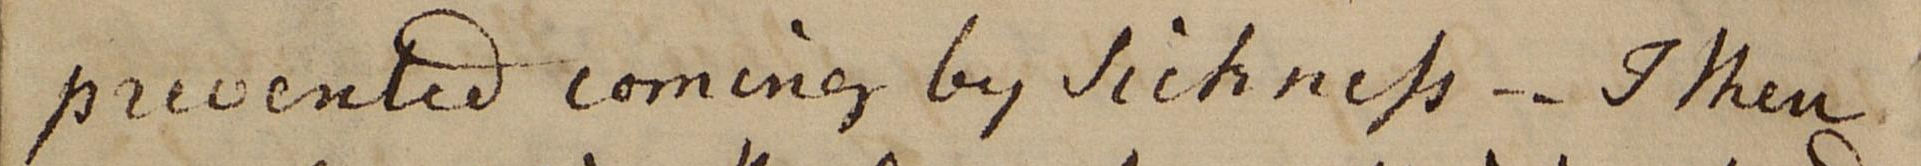prevented coming by Sickness-- I then
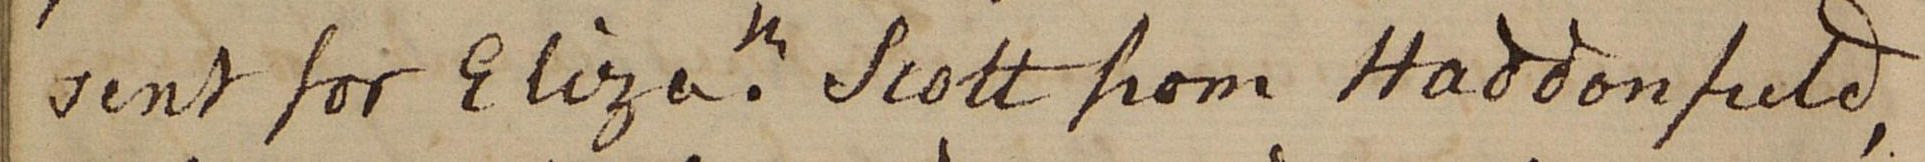sent for Eliza^th. Scott from Haddonfeeld,
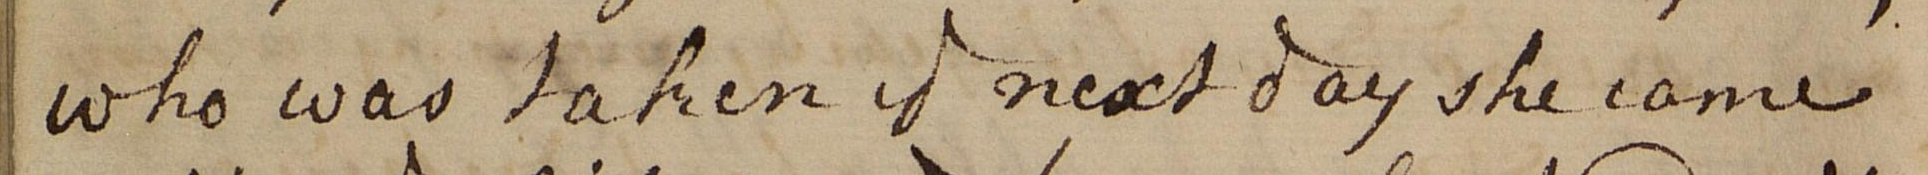who was taken y^e next day she came
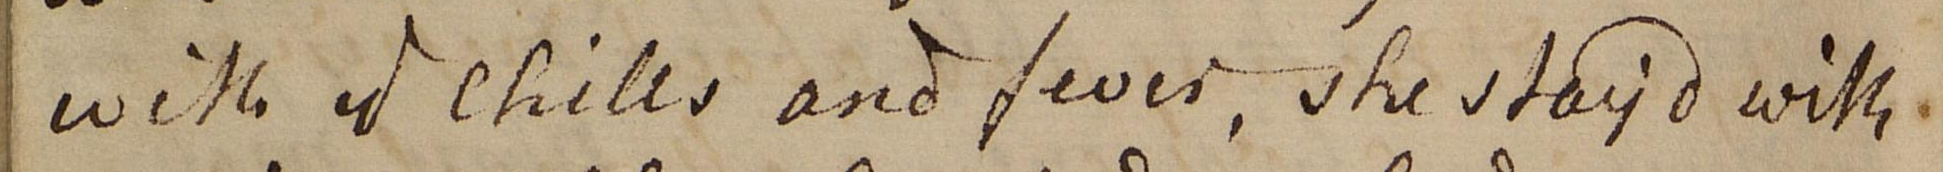with y^e Chills and fever, she stay'd with
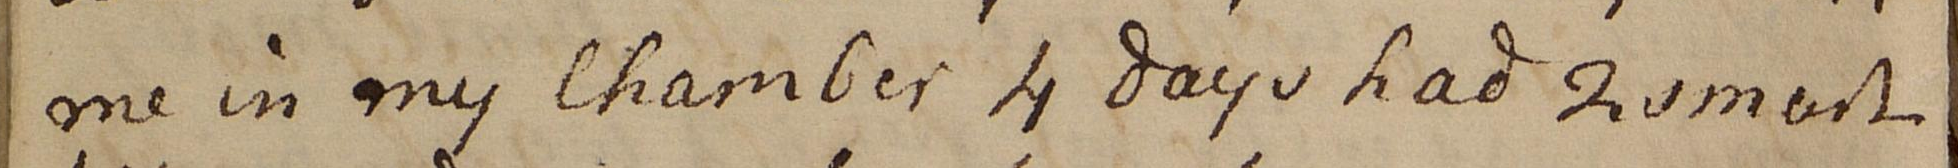me in my Chamber 4 days had 2 smart
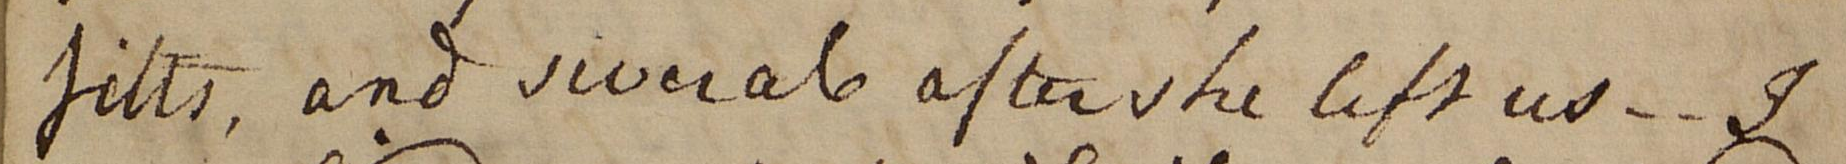fitts, and several after she left us-- I
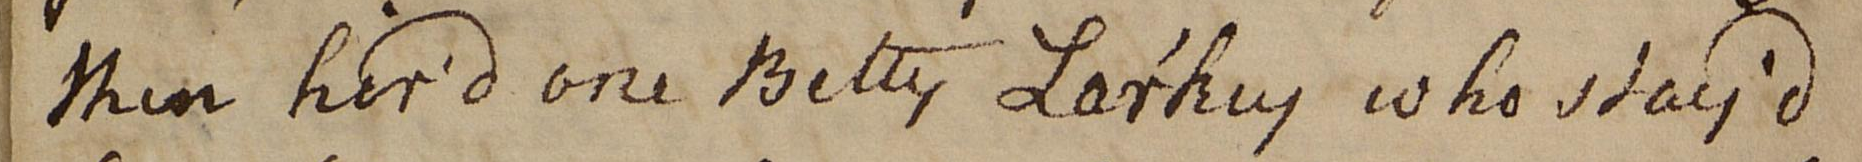then hir'd one Betty Larkey who stay'd
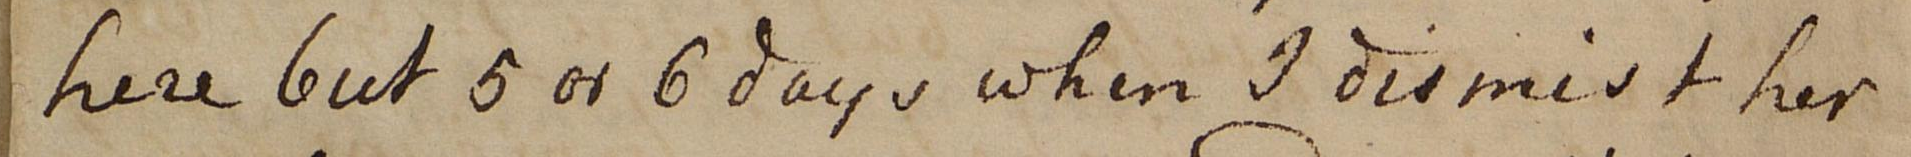here but 5 or 6 days when I dismist her
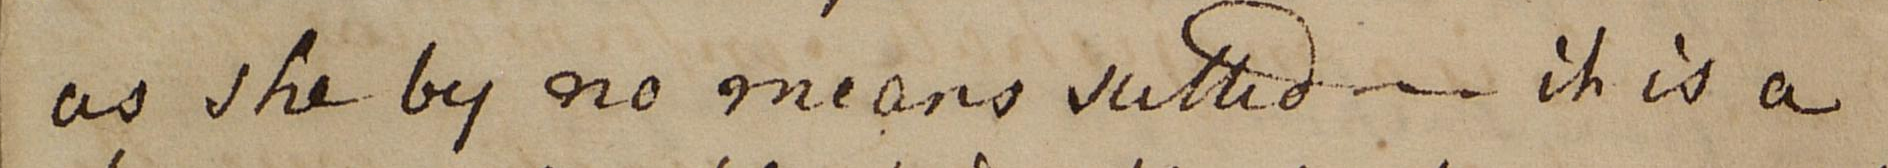as she by no means sutted- it is a
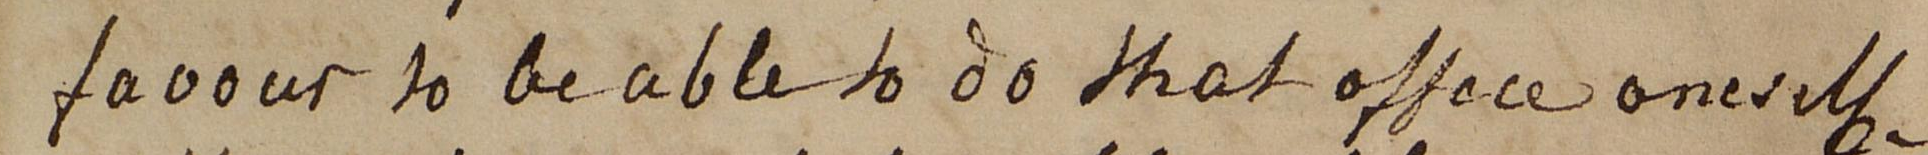favour to be able to do that office oneself-
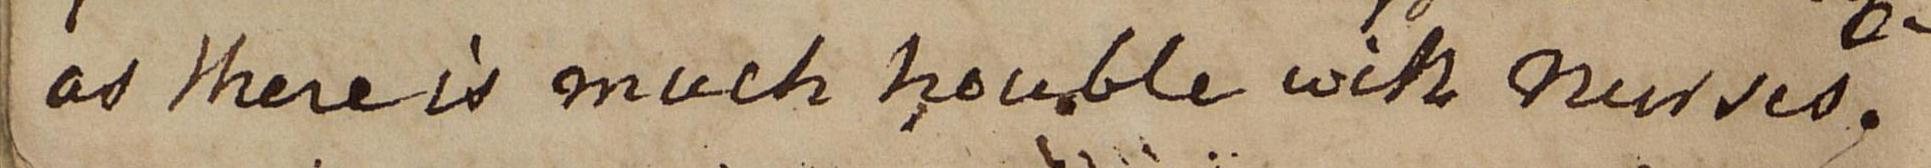as there is much trouble with Nurses.
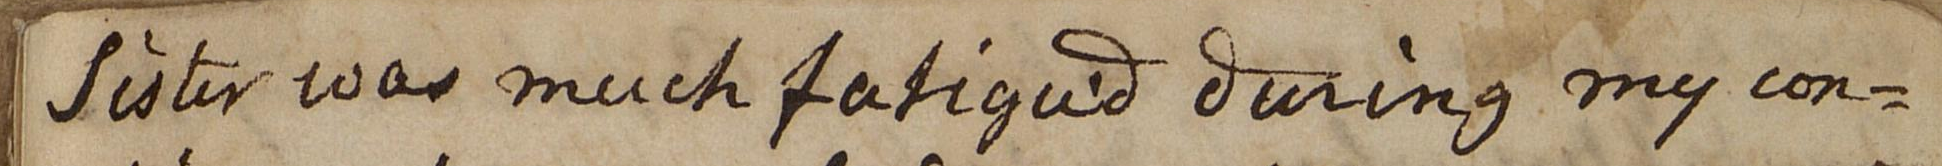Sister was much fatigu'd during my con-
